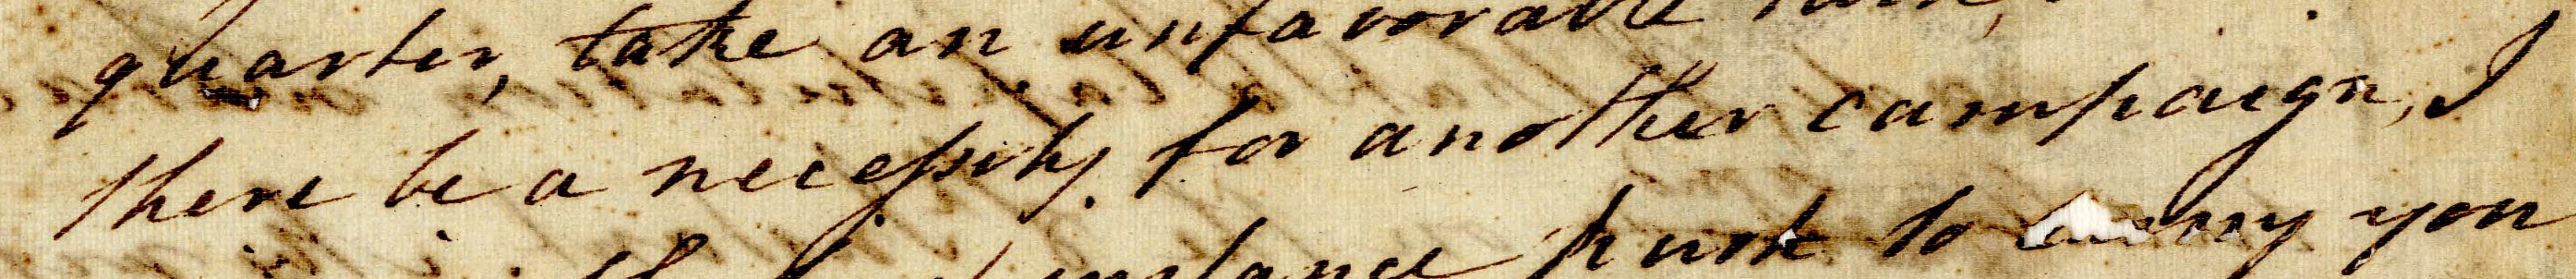there be a necessity for another campaign, I
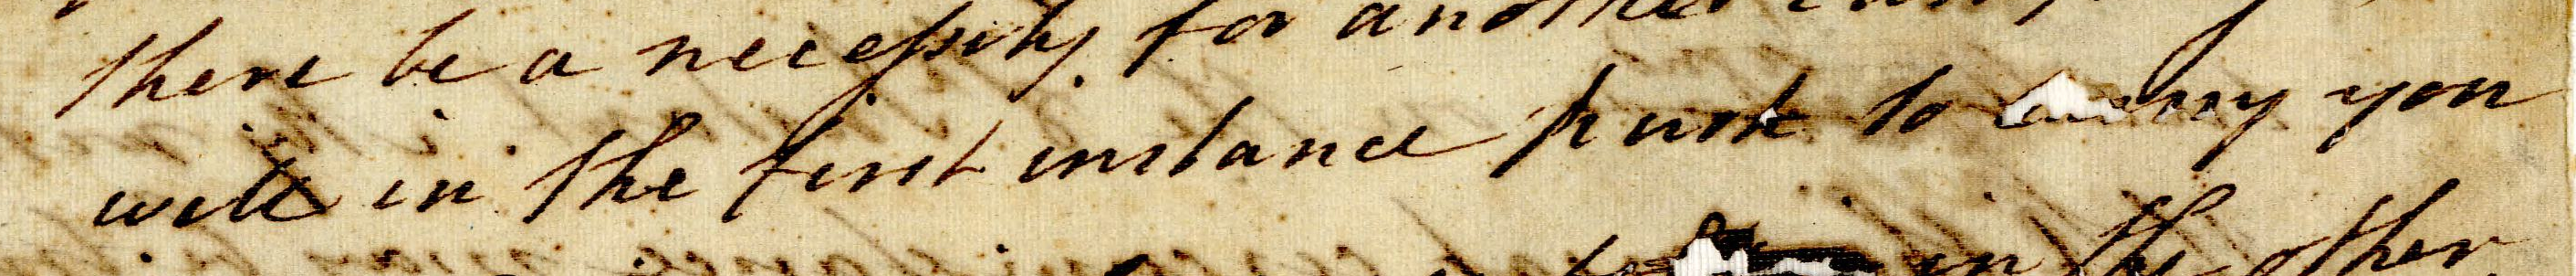will in the first instance push to carry you
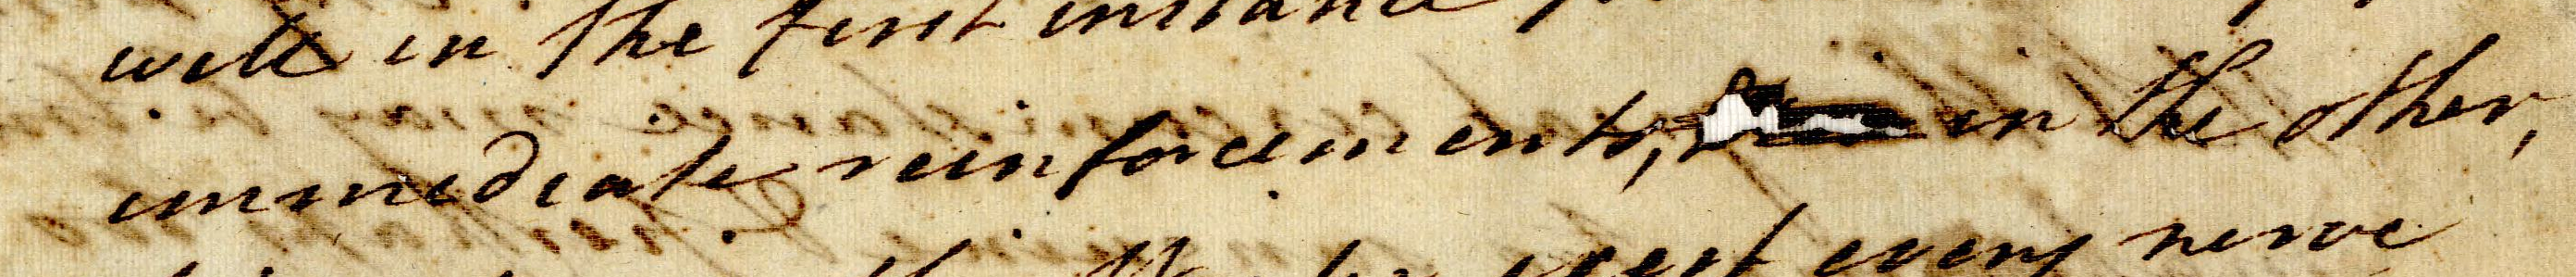immediate reinforcements, [___] in the other;
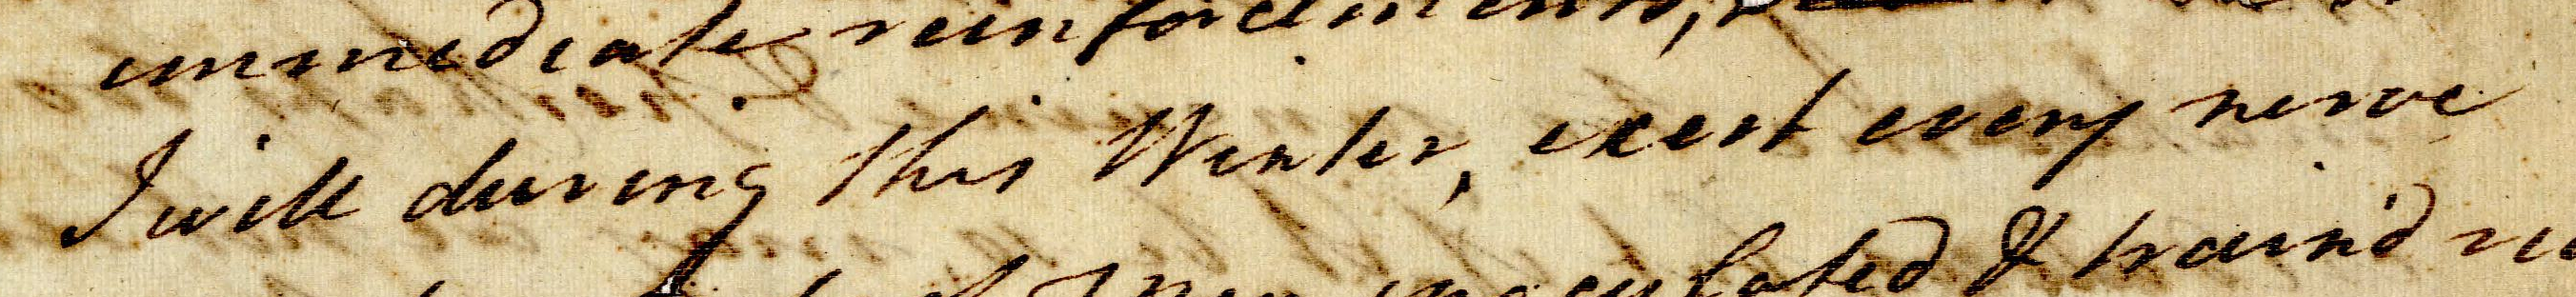I will during this Winter, exert every nerve
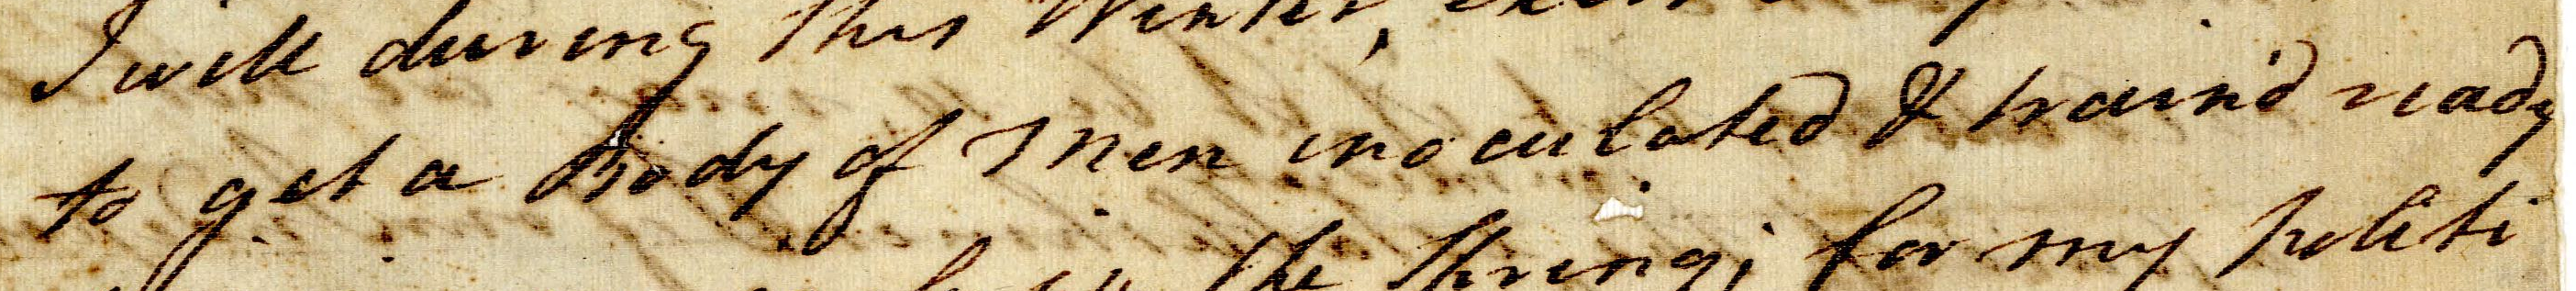to get a Body of Men inoculated & train'd ready
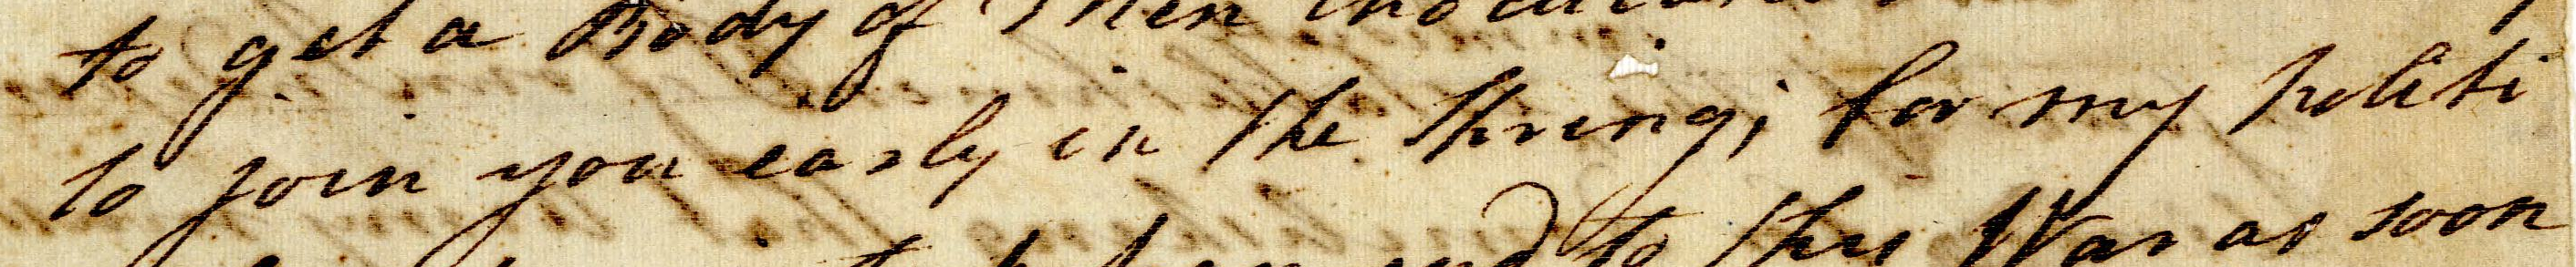to join you early in the Spring; for my politi
